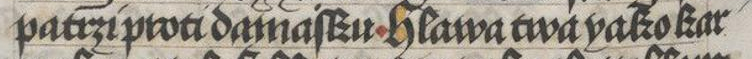patrzí proti damaẛku.Hlawa twa yako kar¬
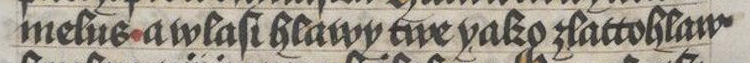melus.a wlaſi hlawy twe yako zlattohlaw.
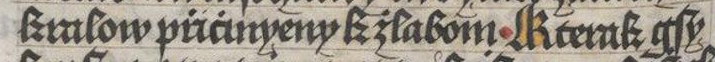kralow pṙiċinyeny k żlabom.Kterak gſy
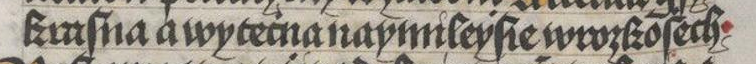kraſna a wyteċná naymileẛyie w rozkoẛech.
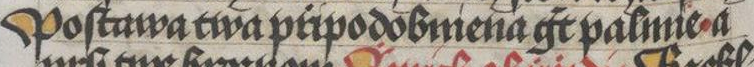Poſtawa twa pṙipodobníena ḡt palmíe.a
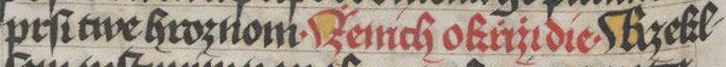prſí twe hroznom.Żenich okṙiżi díe.Rzekl¬
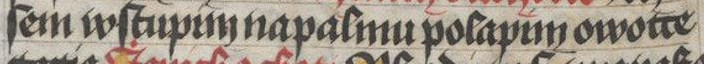ſem wſtupím na palmu polapím owotce
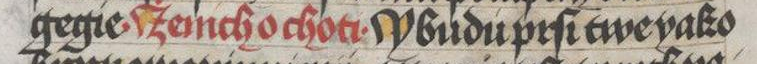gegíe.Żenich o choti.Ybudú prſí twe yako
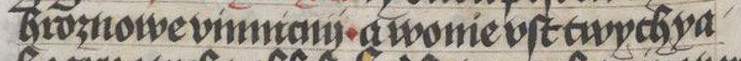hroznowe vinnicnij.a woníe vſt twych ya¬
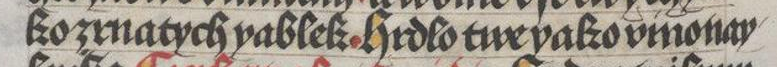ko zrnatych yablek.Hrdlo twe yako vínonay¬
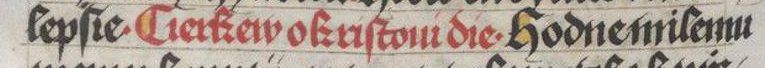lepẛíe.Cierkew okriſtouí díe.Hodne milemu
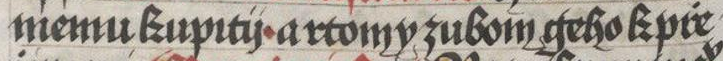memu kupitij.a rtomy zubom geho k pṙe¬
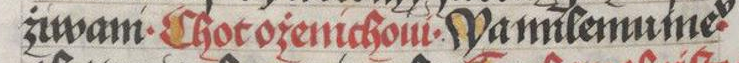żíwaní.Chot oženichoui.Ya milemu mev.
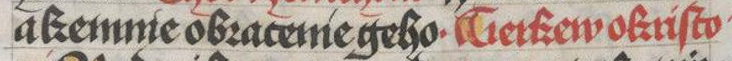a ke mníe obraceníe geho. Cierkew okriſto¬
